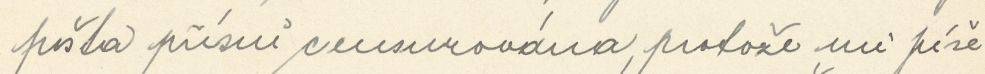pošta přísně censurována, protože mi píše
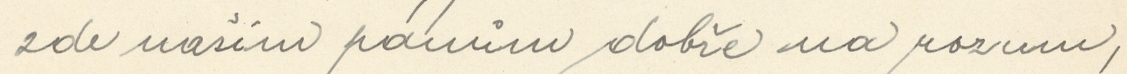zde naším pánům dobře na rozum,
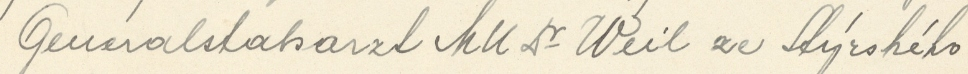Generalstabsarzt MUDr Weil ze Štýrského
